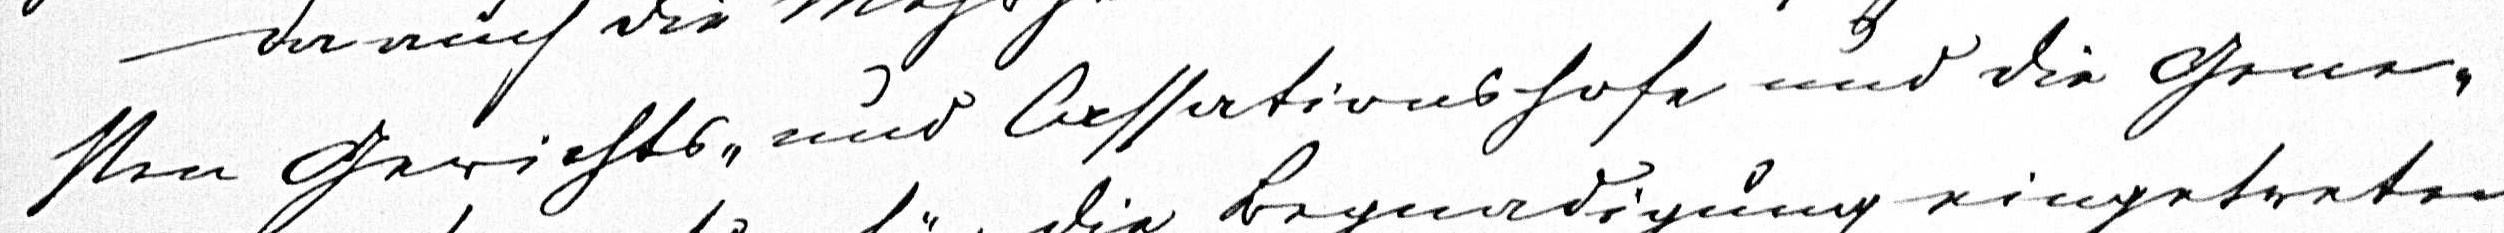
sten Gerichts- und Cassationshofe und die Gene¬
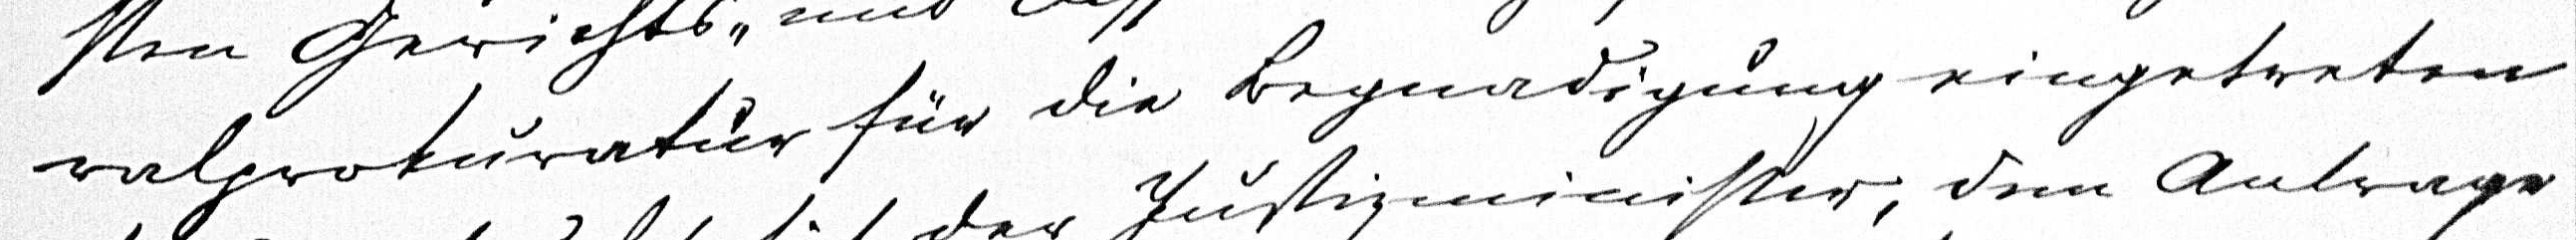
ralprokuratur für die Begnadigung eingetreten
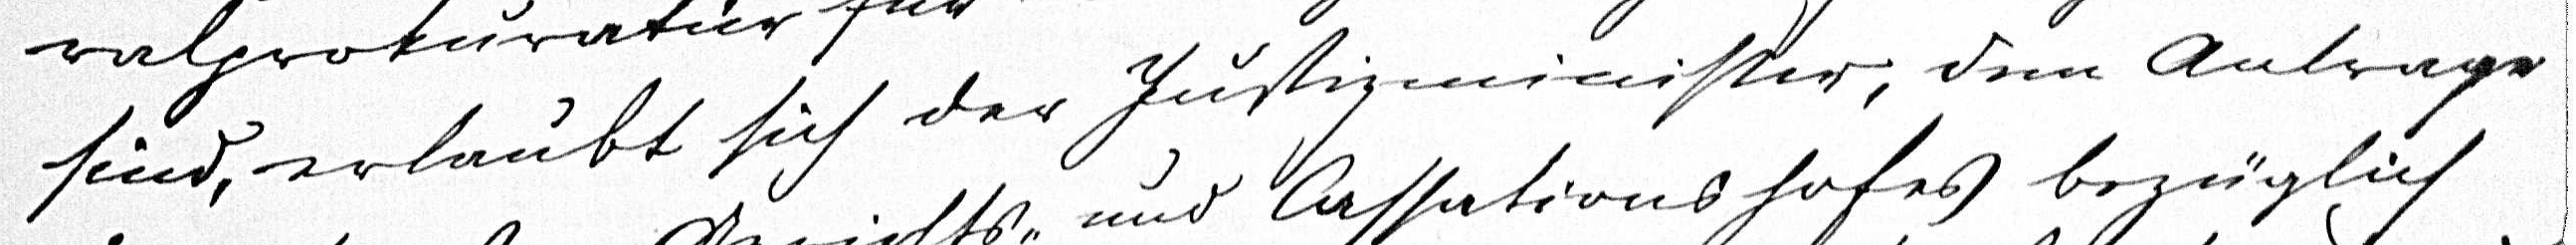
sind, erlaubt sich der Justizminister, den Antrage
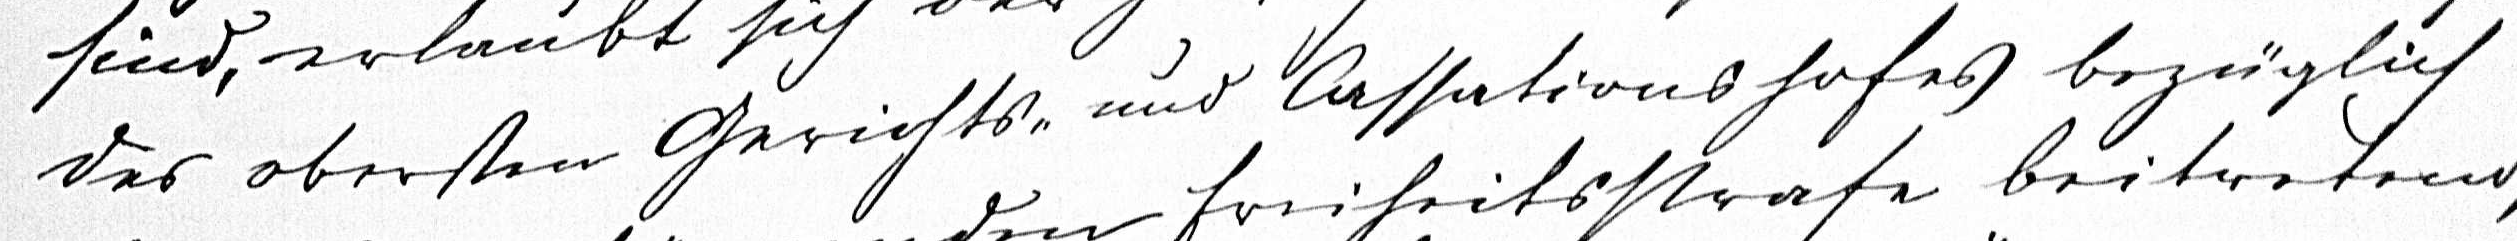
des obersten Gerichts- und Cassationshofes bezüglich
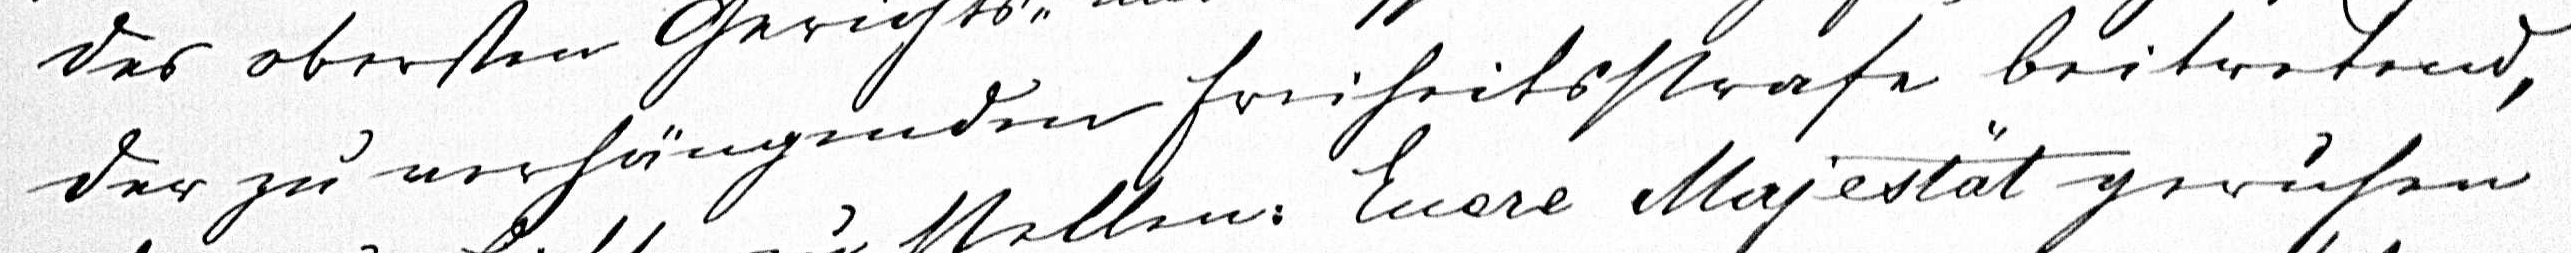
der zu verhängenden Freiheitsstrafe beitretend,
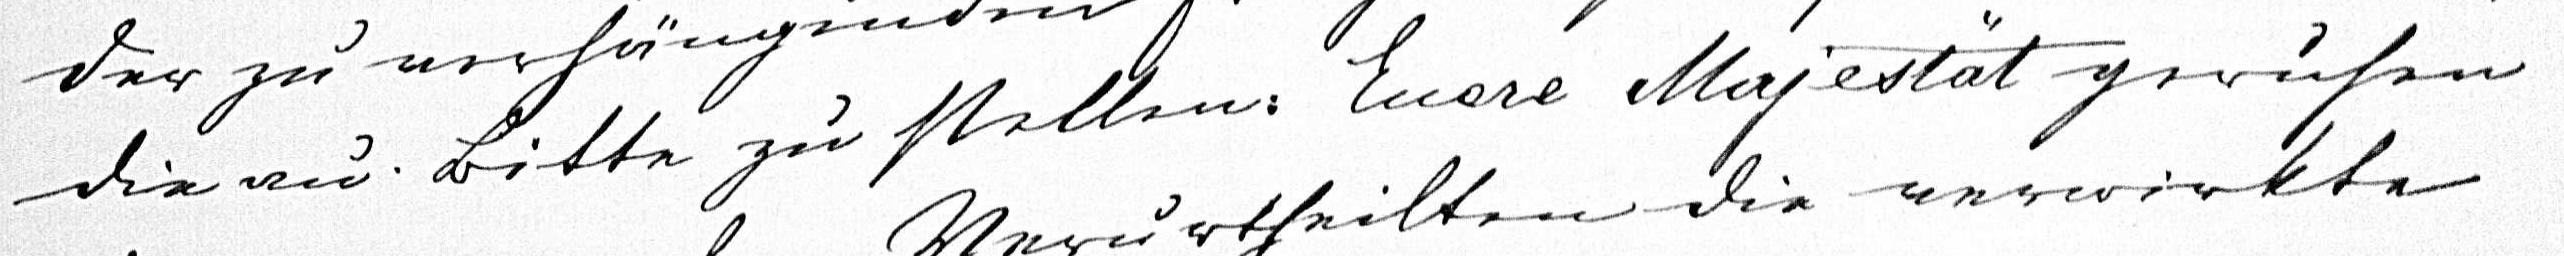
die au. Bitte zu stellen: Euere Majestät geruhen
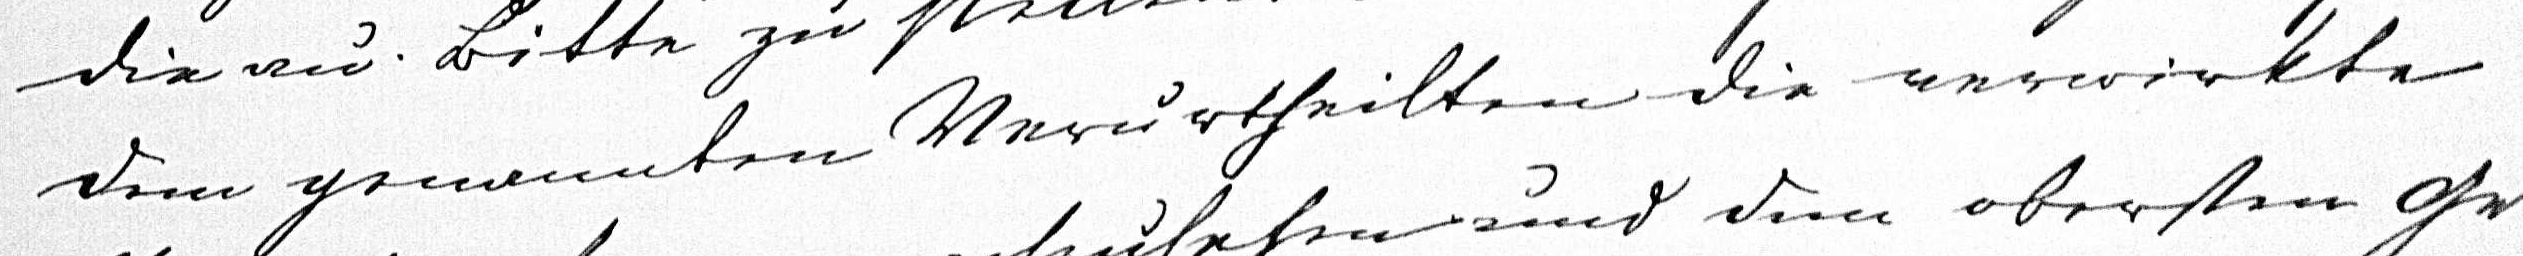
dem genannten Verurtheilten die verwirkte
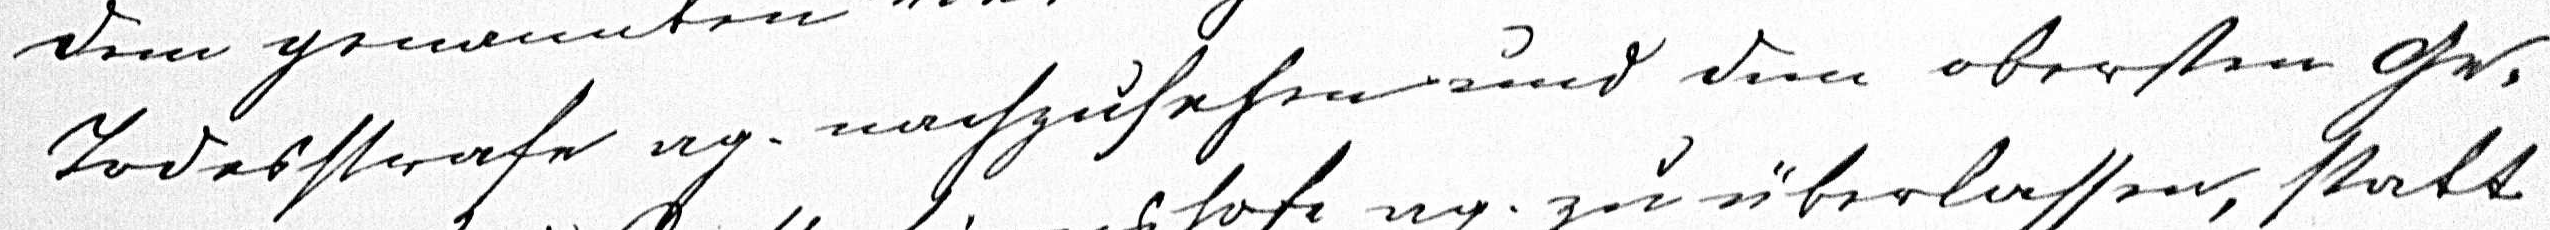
Todesstrafe ag. Nachzusehen und dem obersten Ge¬
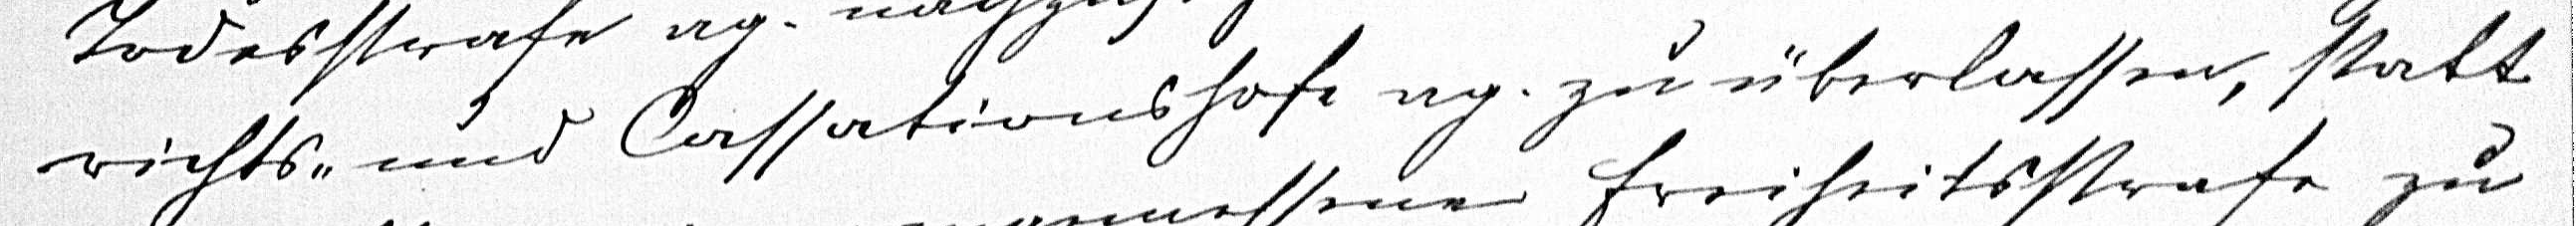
richts- und Cassationshofe ag. zu überlassen, statt
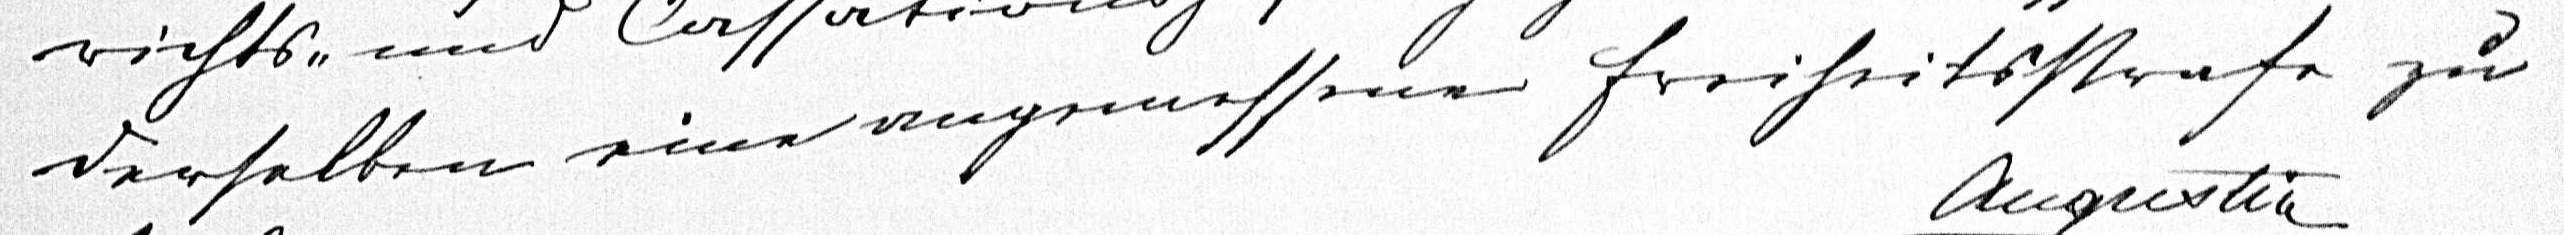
derselben eine angemessene Freiheitsstrafe zu
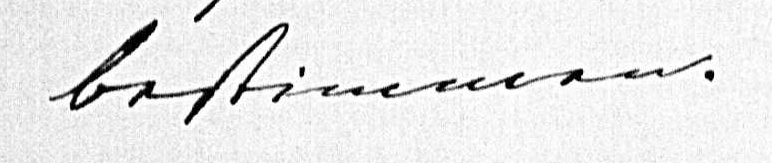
bestimmen.
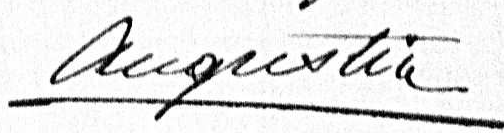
Augustin
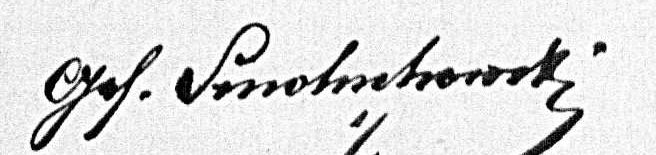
Grf Smolenkowski
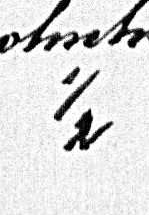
½
